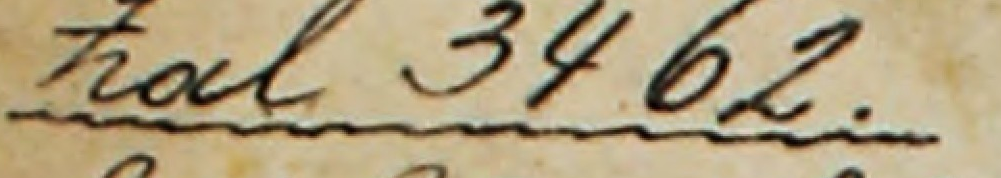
Zal 3462.
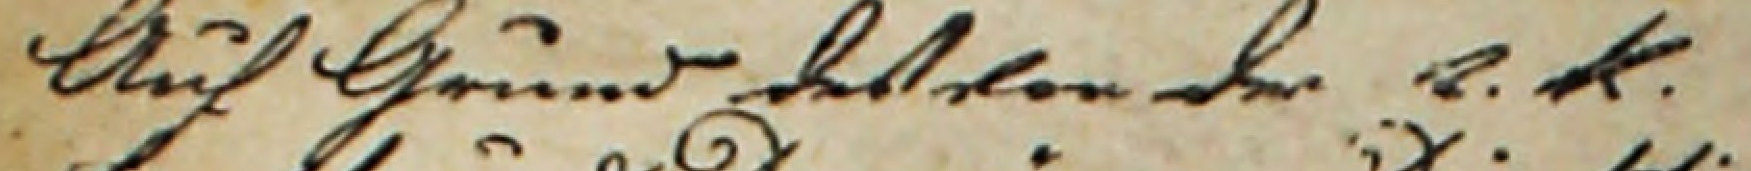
Auf Grund des von der k.k.
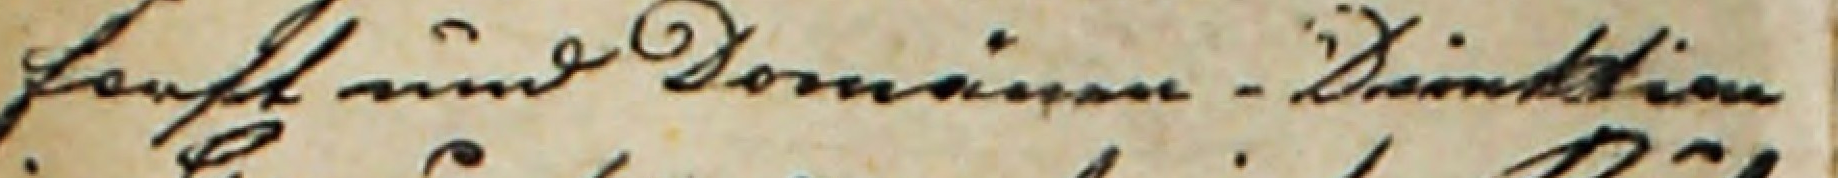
Forst und Domänen - Direktion
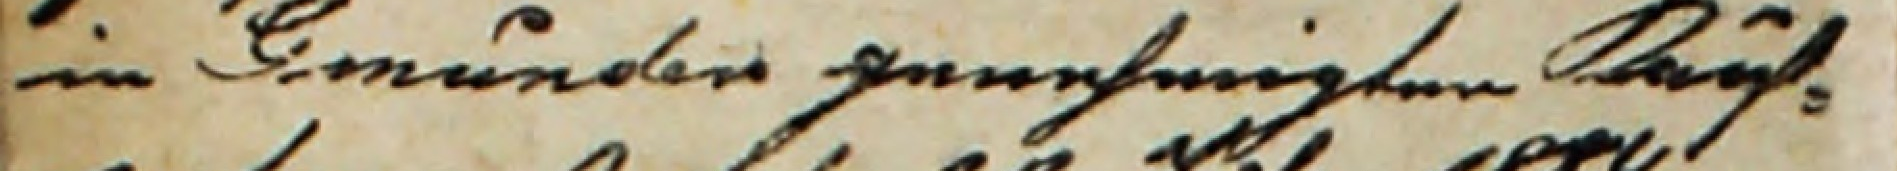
in Gmunden genehmigten Kauf=
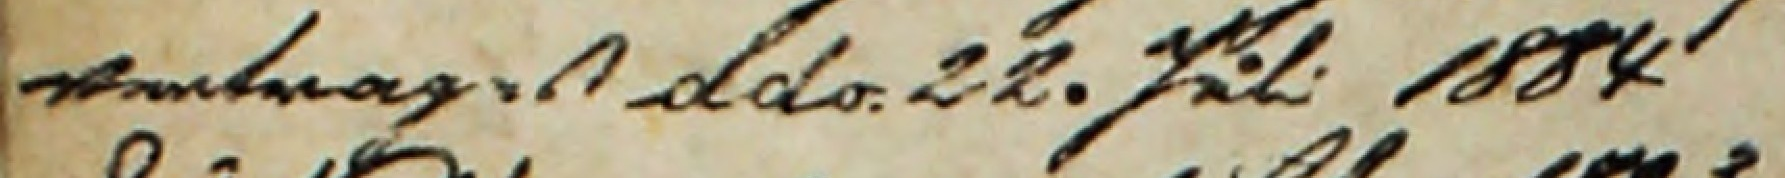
vertrages ddo. 22. Juli 1884
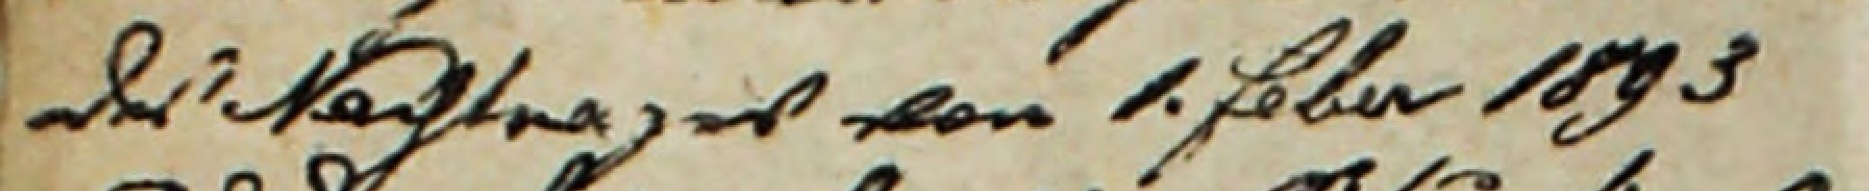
des ? Nachtrages von 1. Feber 1893
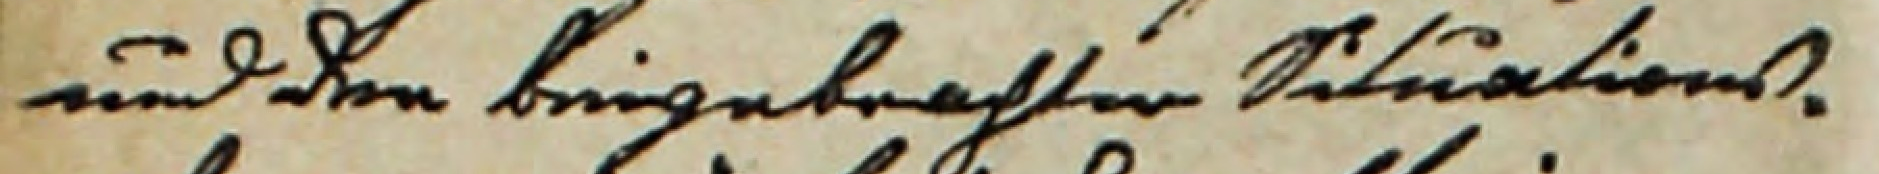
und den beigebrechten Situations=
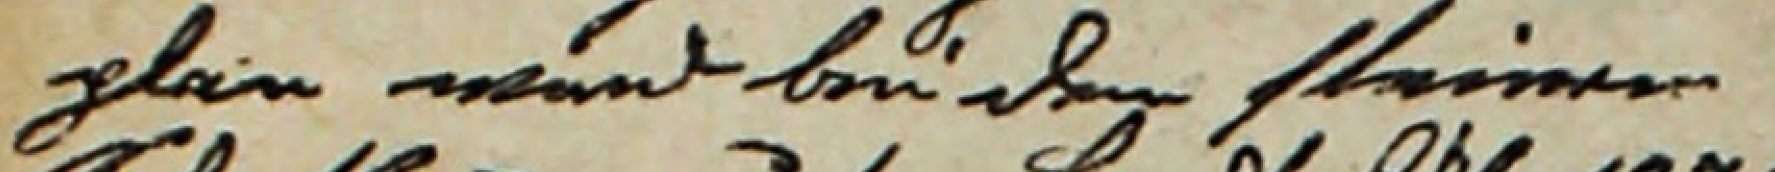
plan wand beiden steinen
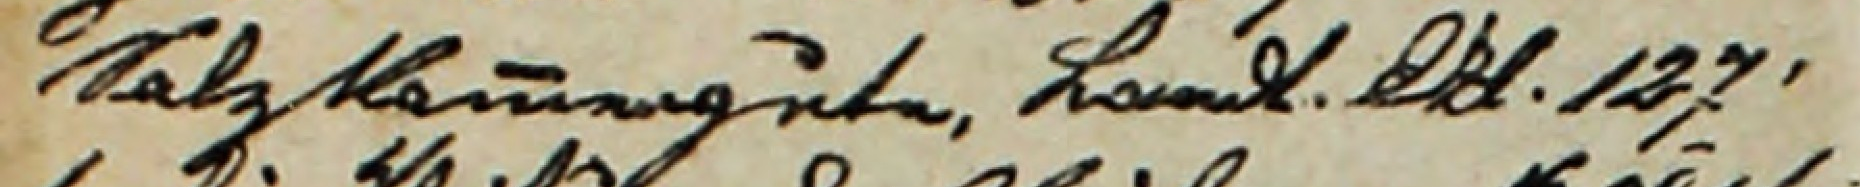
Salzkammergute, Landl. Ub. 127
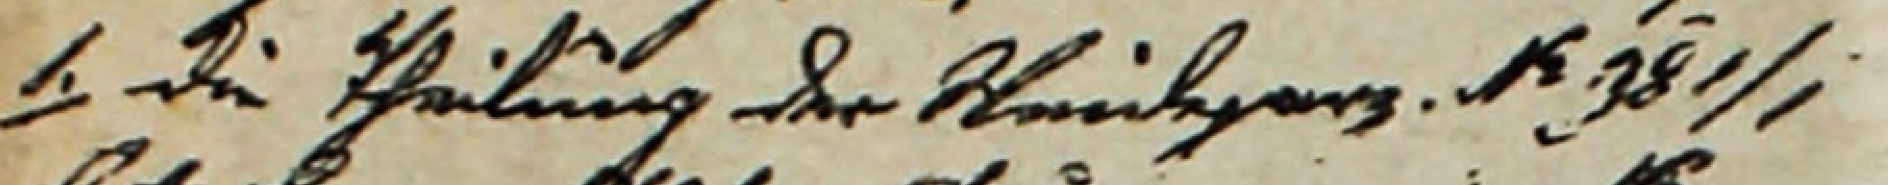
1. Die Theilung der Weidepars No 381/1
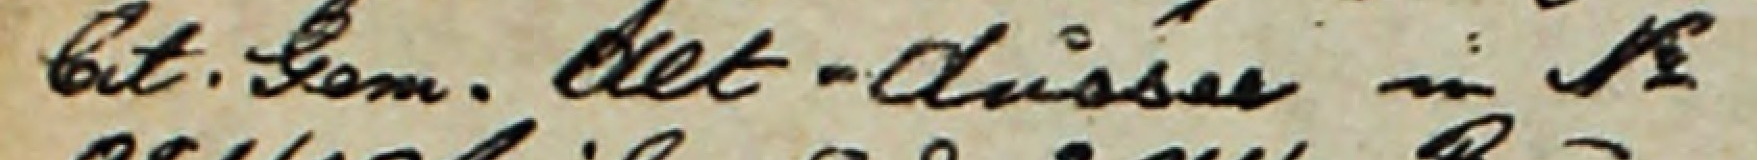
bit. Gem. Alt - Aussee in No
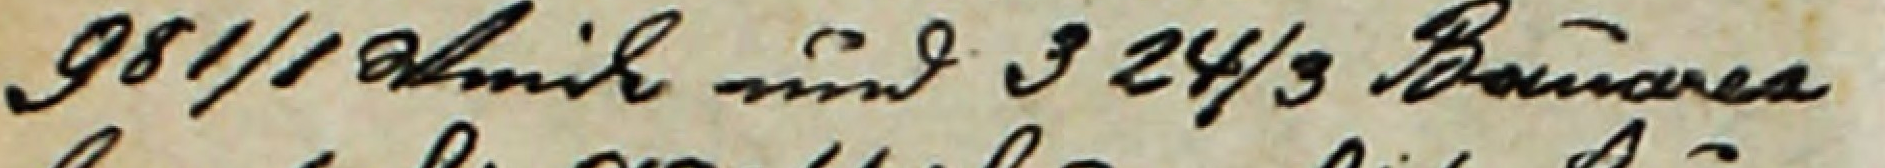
981/1 Weide und 324/3 Bauarea
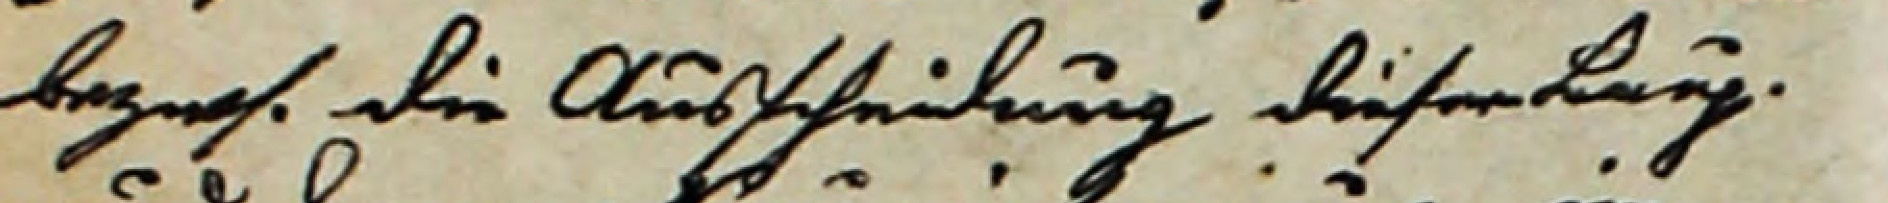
bezech. Die Ausscheidung diesen Baup.
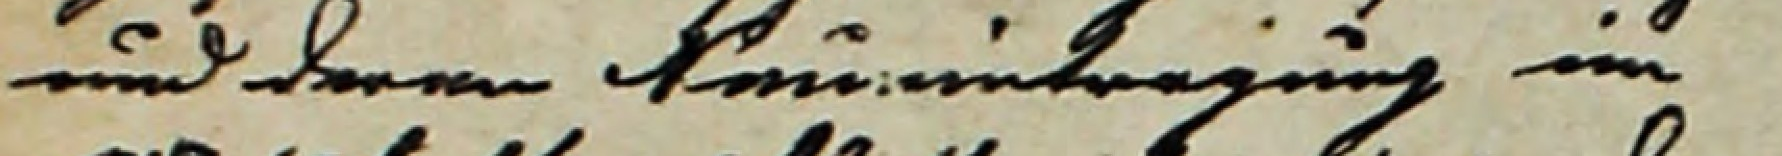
und deren Neueintragung im
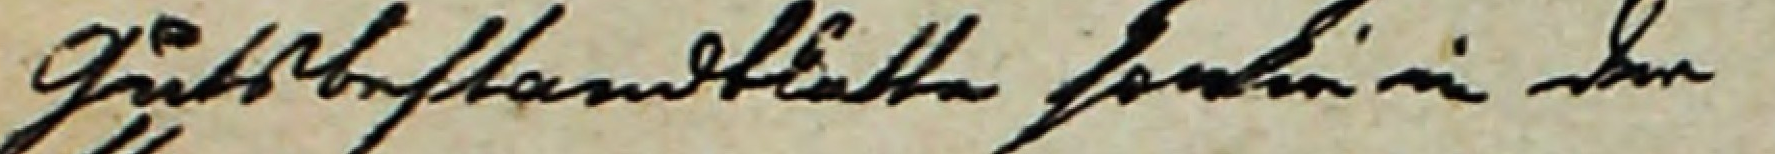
Gutsbestandblatte sowie in der
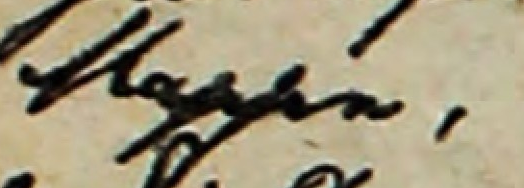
Kappe,
